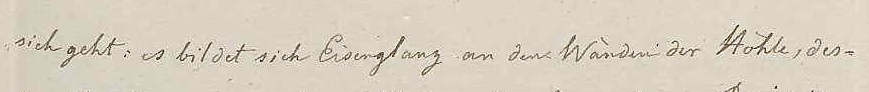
sich geht: es bildet sich Eisenglanz an den Wänden der Höhle, des-
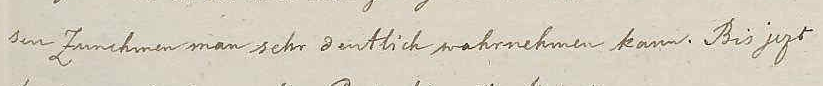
sen Zunehmen man sehr deutlich wahrnehmen kann. Bis jezt
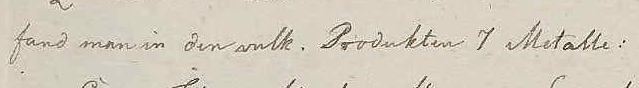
fand man in den vulk. Produkten 7 Metalle:
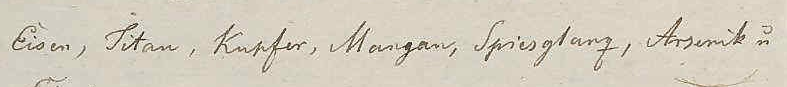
Eisen, Titan, Kupfer, Mangan, Spiesglanz, Arsenik u
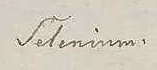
Selenium.
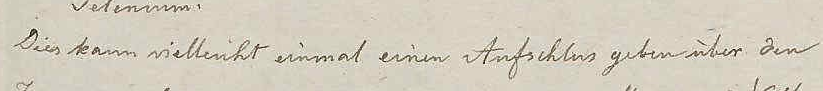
Dies kann vielleicht einmal einen Aufschlus geben über den
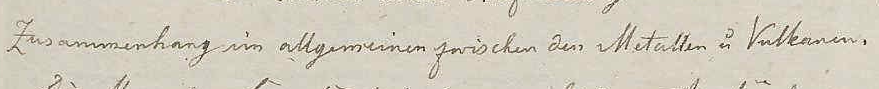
Zusammenhang im allgemeinen zwischen den Metallen u Vulkanen.
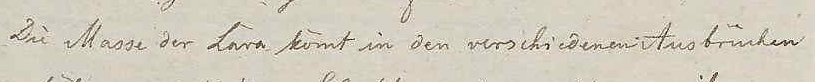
Die Masse der Lava kömt in den verschiedenen Ausbrüchen
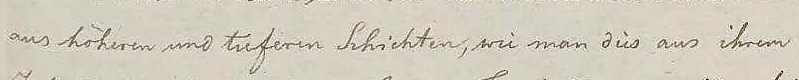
aus höheren und tieferen Schichten, wie man dies aus ihrem
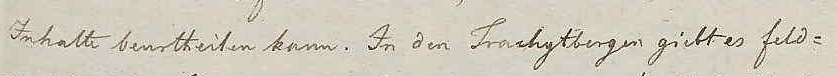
Inhalte beurtheilen kann. In den Trachytbergen giebt es feld-
